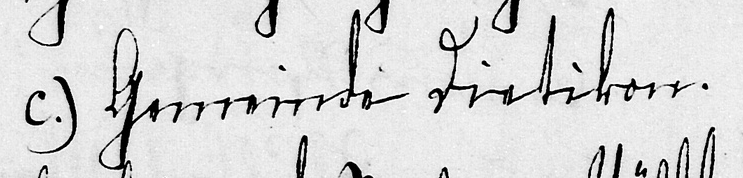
c.) Gemeinde Dietikon.
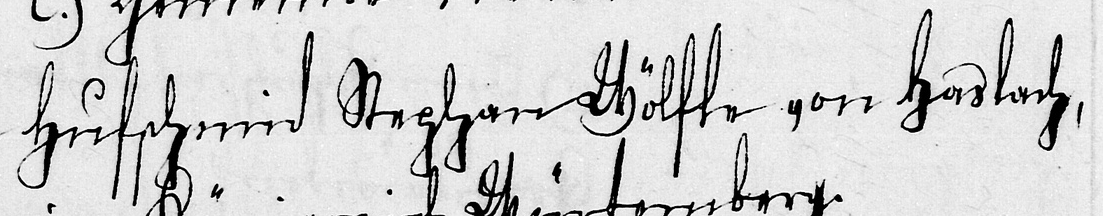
Hufschmid Stephan Wölfe von Haslach
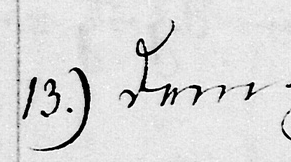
13.) Dem
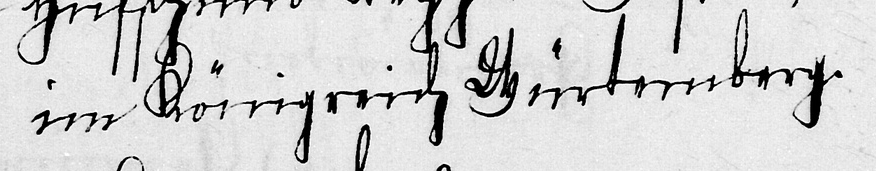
im Königreich Würtemberg.
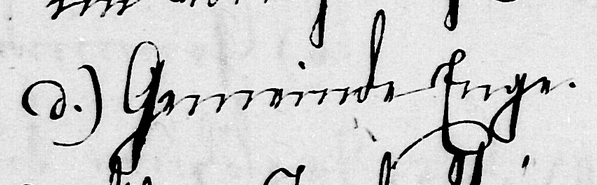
d.) Gemeinde Enge.
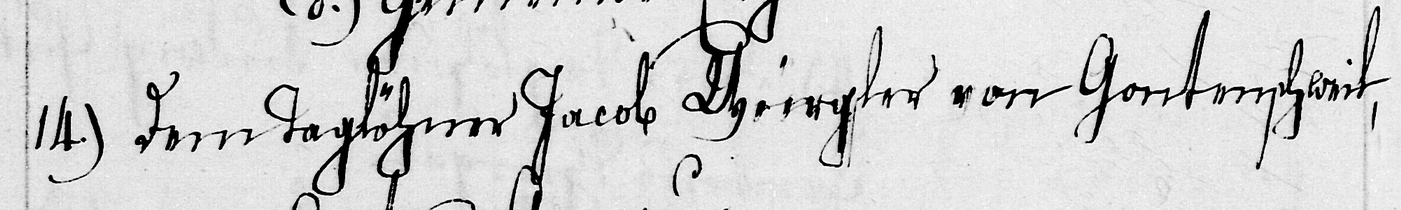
14.) Dem Taglöhner Jacob Würgler von Gontenschwei¬
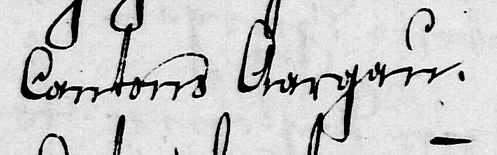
Cantons Aargau.
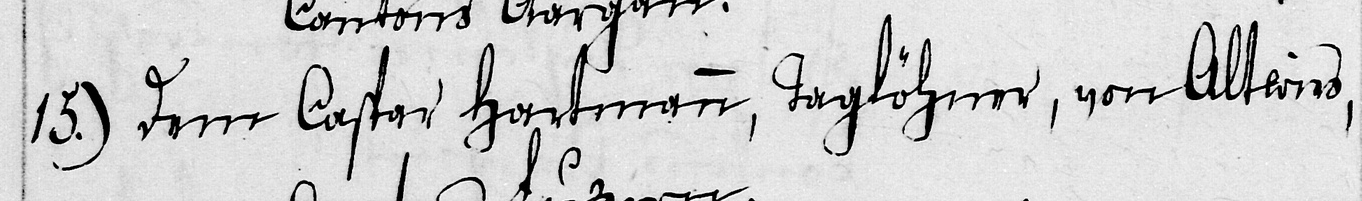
15.) Dem Caspar Hartmann, Taglöhner, von Altwies,
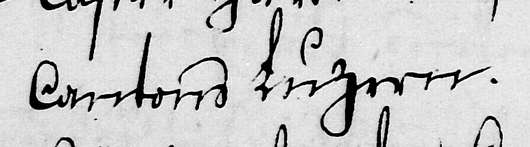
Cantons Luzern.
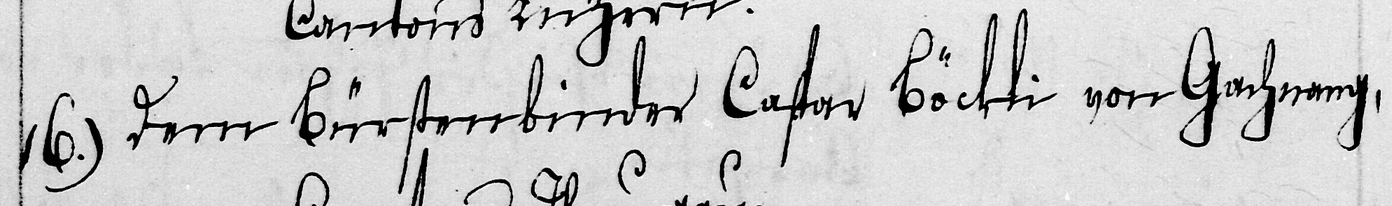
16.) Dem Bürstenbinder Caspar Böckli von Gachnang,
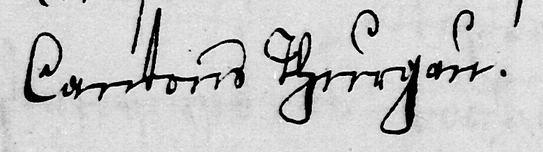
Cantons Thurgau.
